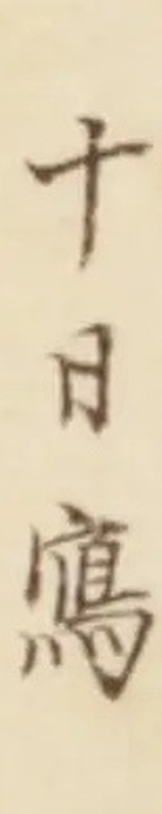十日寫
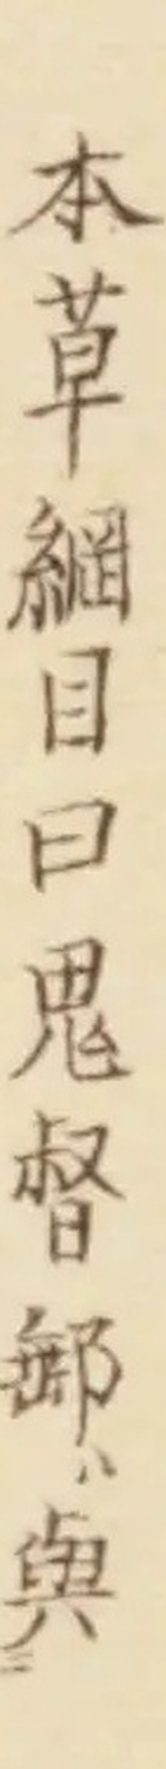本草綱目曰鬼督郵は與
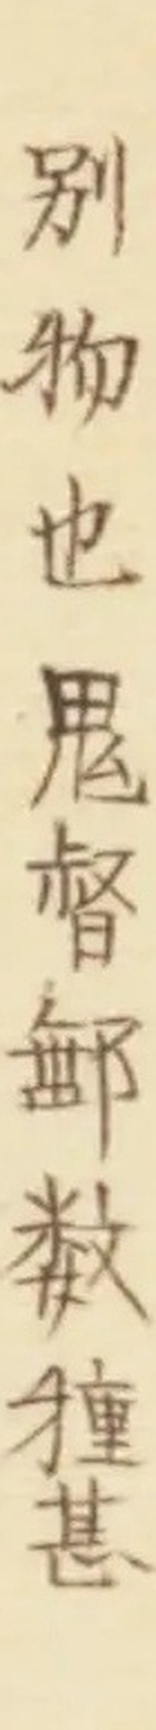別物なり鬼督郵数種甚

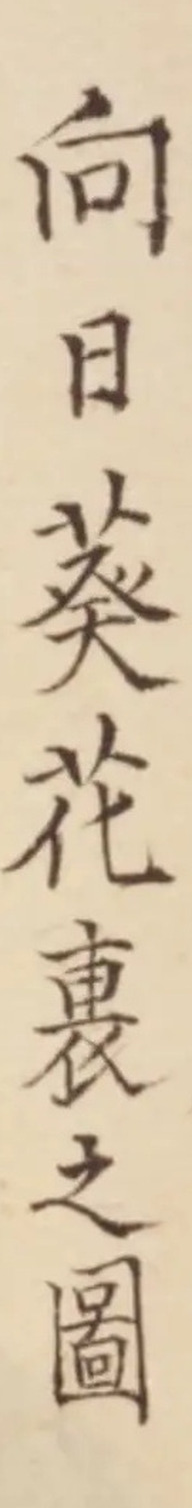向日葵花裏之圖
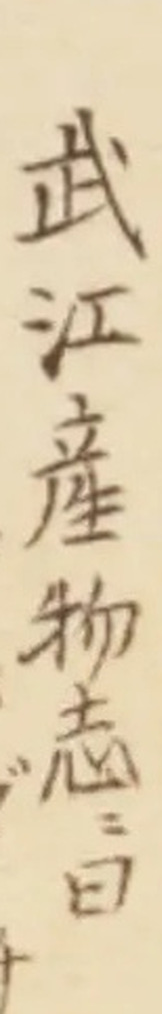武江産物志に曰
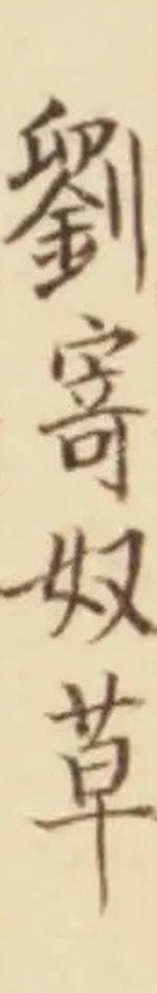劉寄奴草
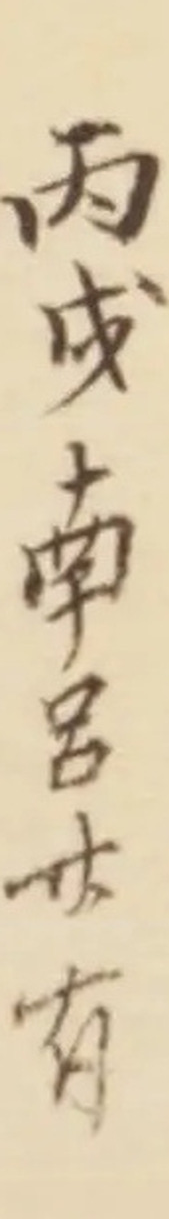丙戌南呂廿有
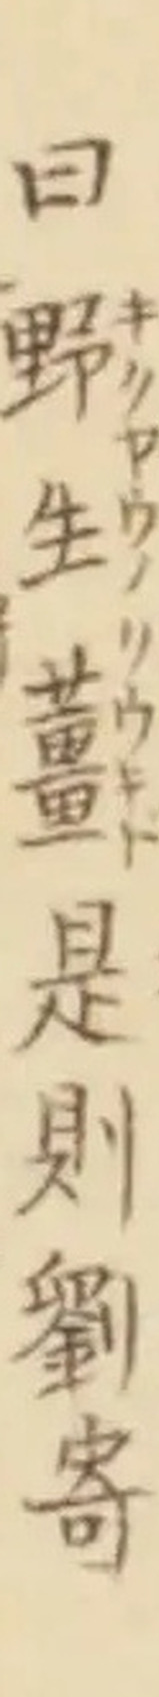曰野生薑是則劉寄
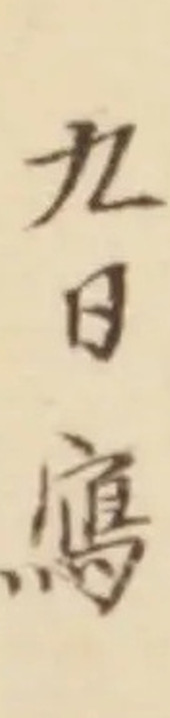九日寫

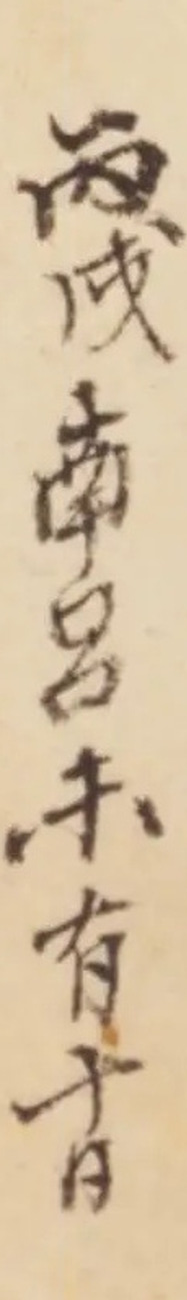丙戌南呂末有十日
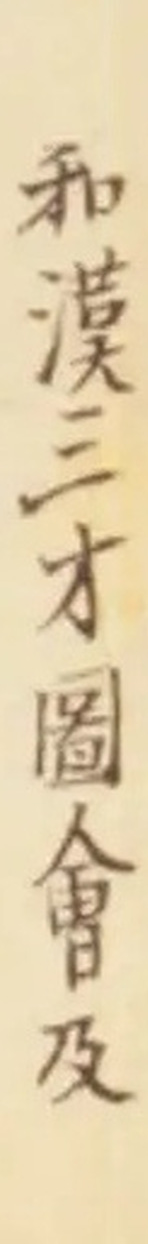和漢三才圖會及
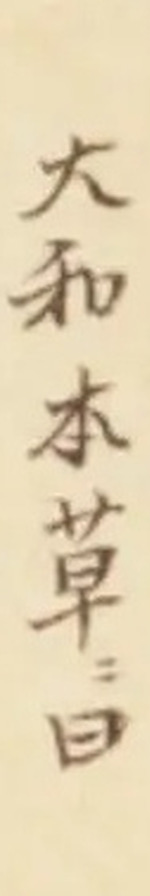大和本草に曰
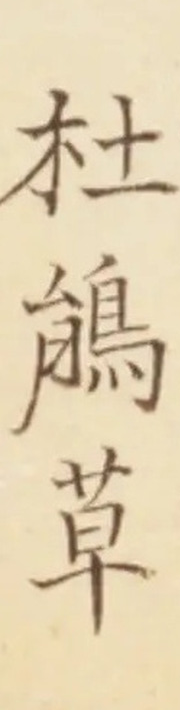杜鵑草
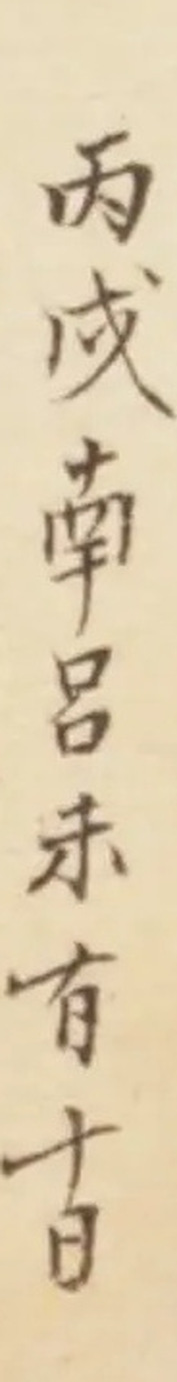丙戌南呂末有十日

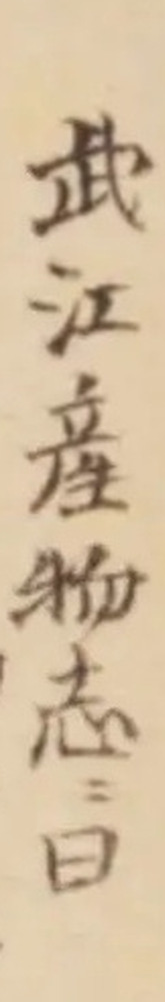武江産物志に曰
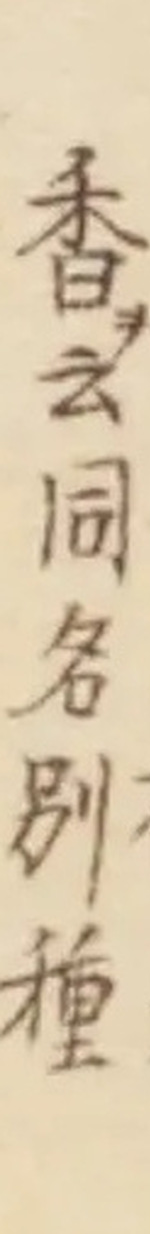香を云同名別種
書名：梅園草木花譜秋之部. 3
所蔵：国立国会図書館 National Diet Library, JAPAN
